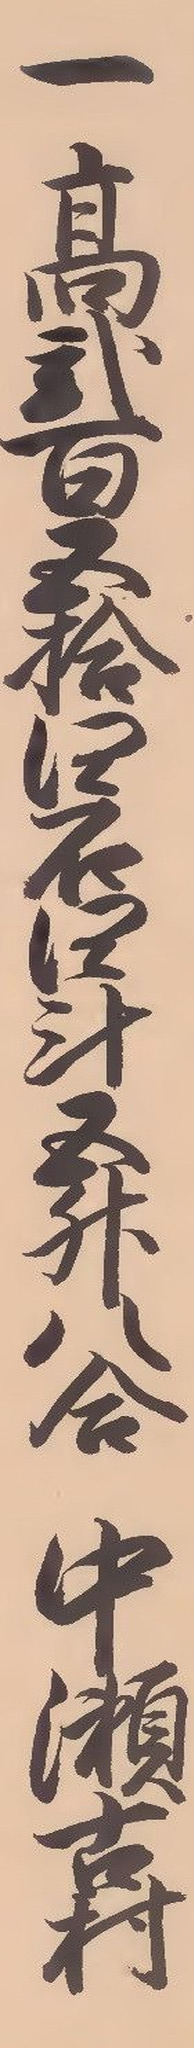一高弐百五拾四石四斗五升八合中瀬古村
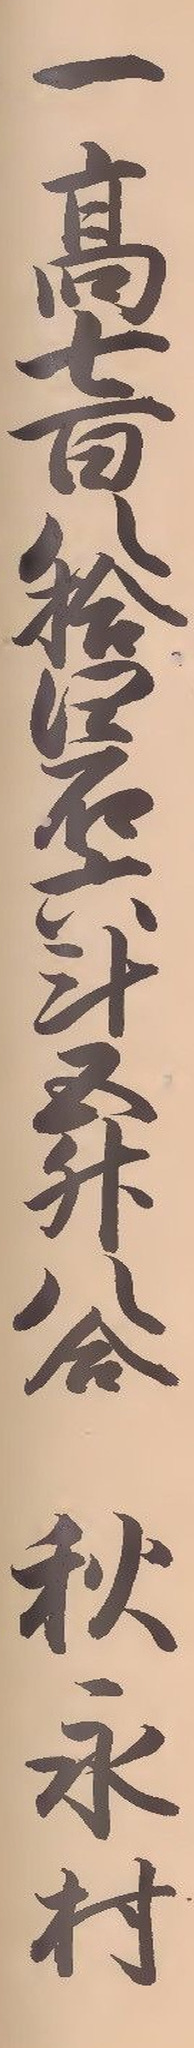一高七百八拾四石六斗五升八合秋永村
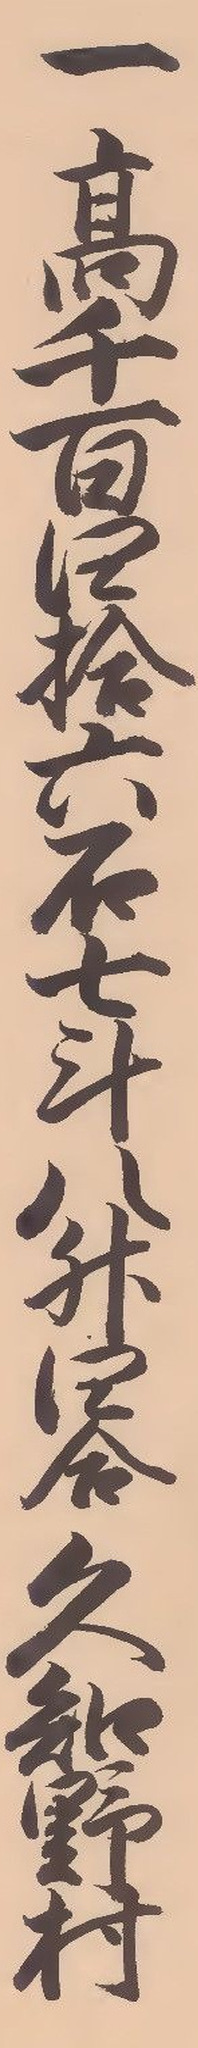一高千百四拾六石七斗八升四合久知野村

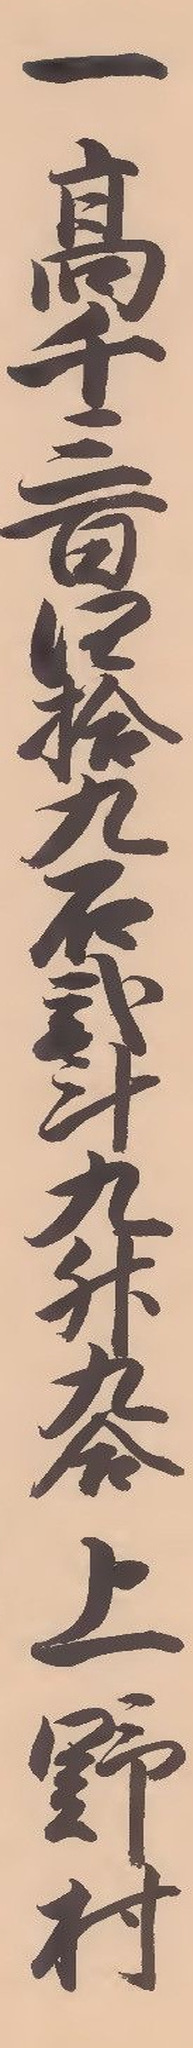一高千三百四拾九石弐斗九升九合上野村
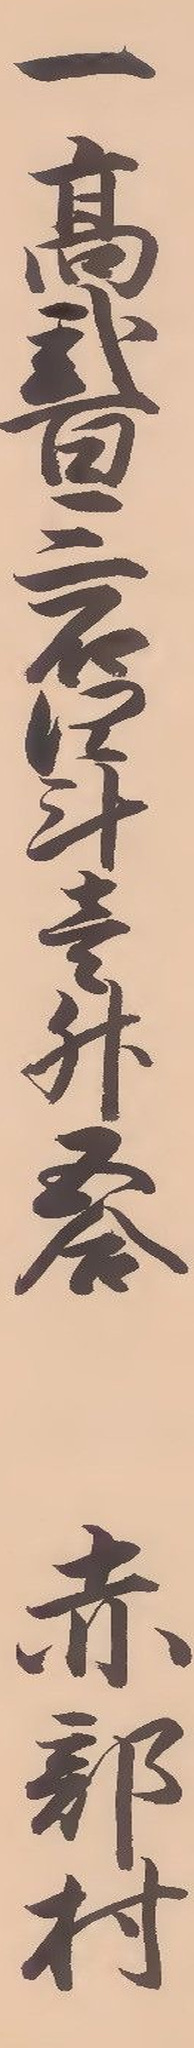一高弐百三石四斗壱升五合赤部村
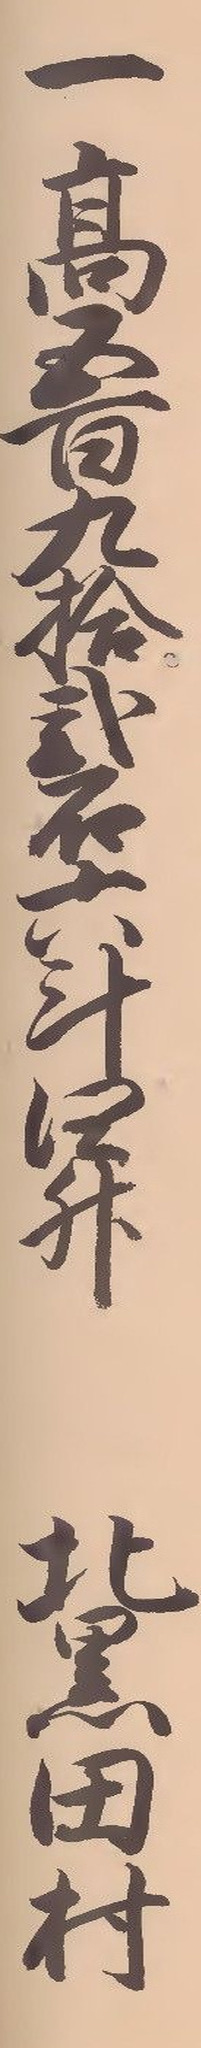一高五百九拾弐石六斗四升北黒田村
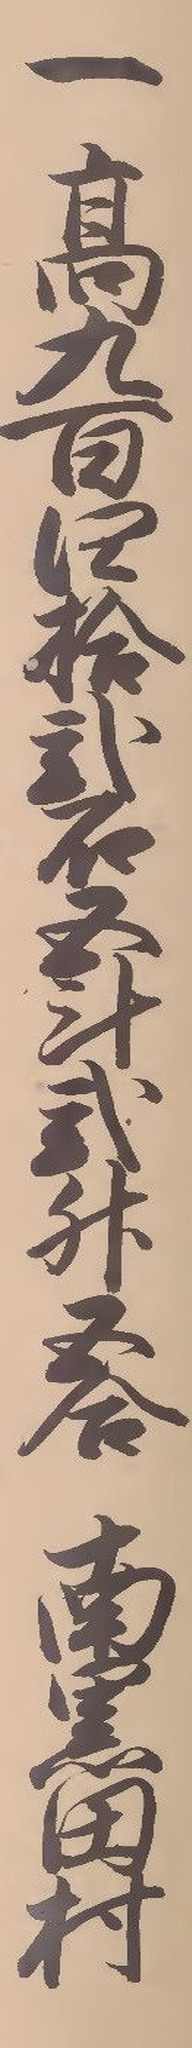一高九百四拾弐石五斗弐升五合南黒田村
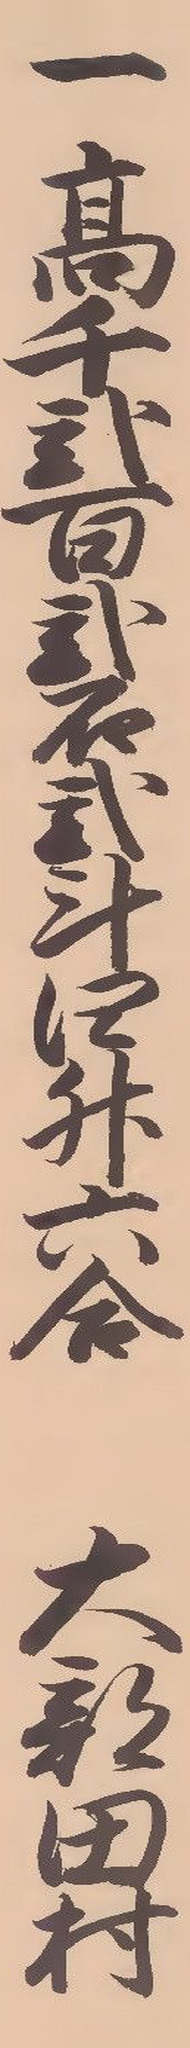一高千弐百弐石弐斗四升六合大部田村
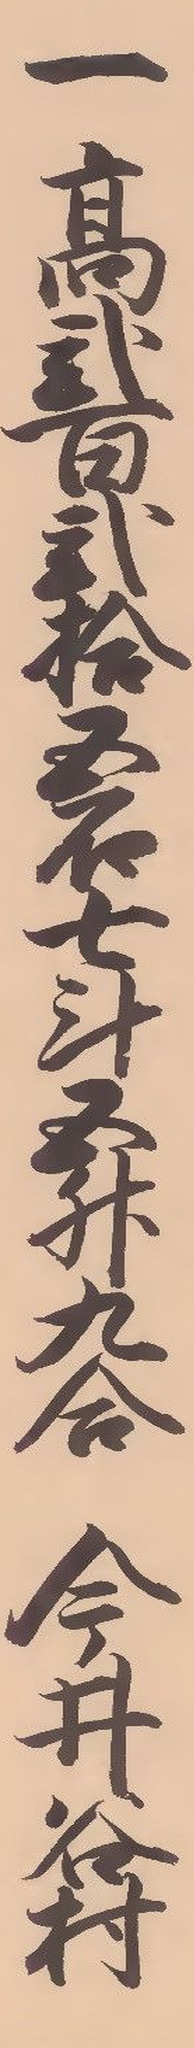一高弐百弐拾五石七斗五升九合今井谷村

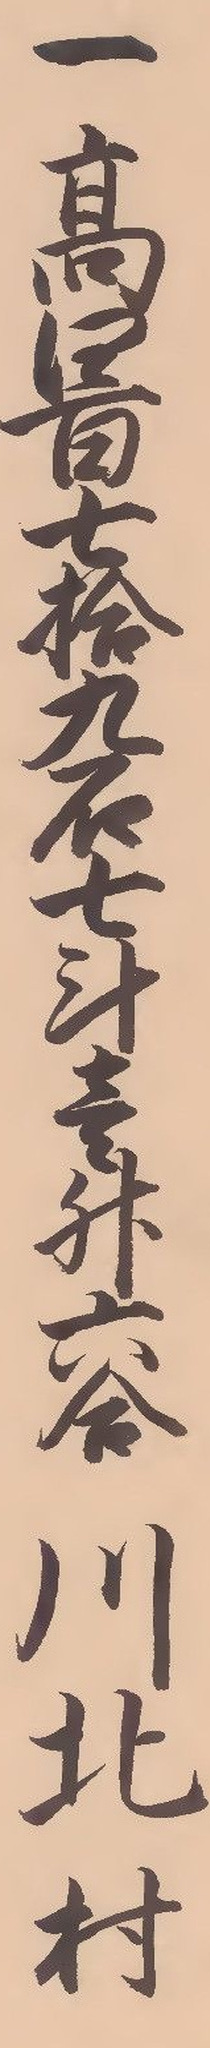一高四百七拾九石七斗壱升六合川北村
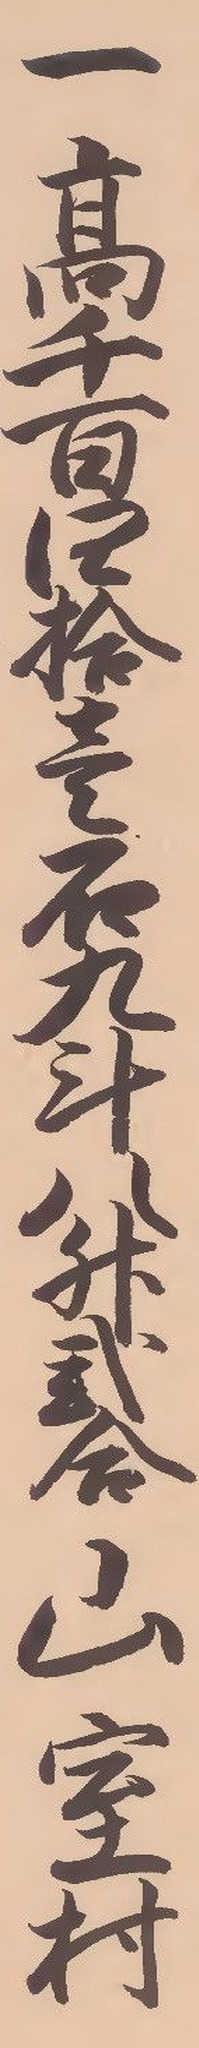一高千百四拾壱石九斗八升弐合山室村
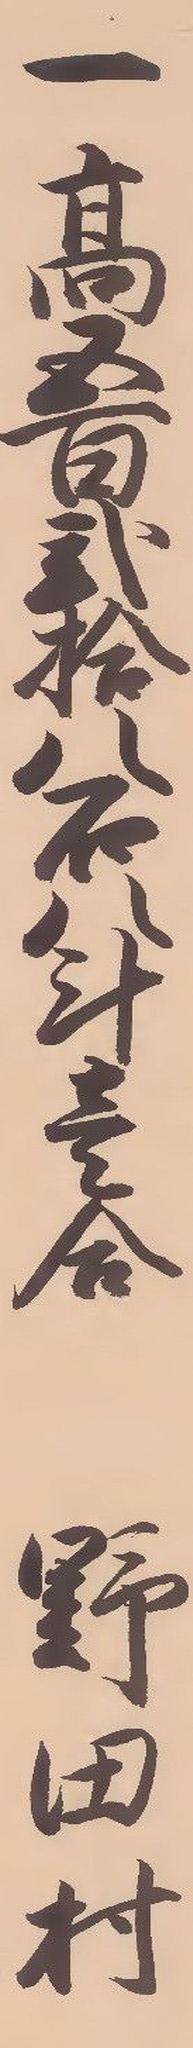一高五百弐拾八石八斗壱合野田村
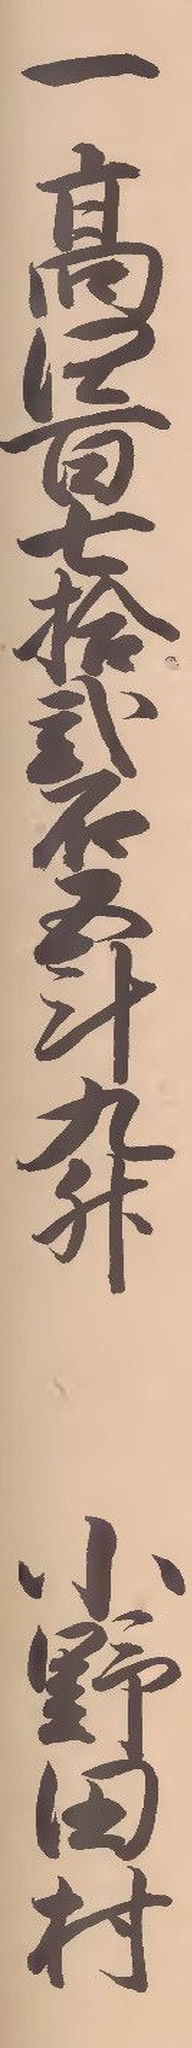一高四百七拾弐石五斗九升小野田村
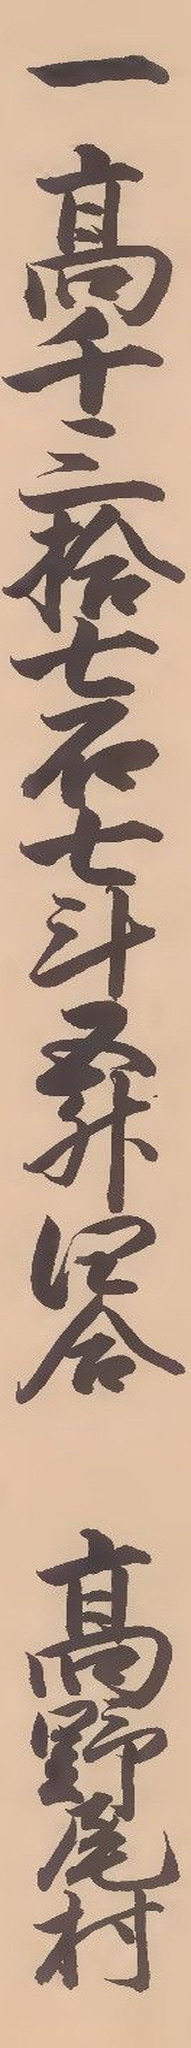一高千三拾七石七斗五升四合高野尾村
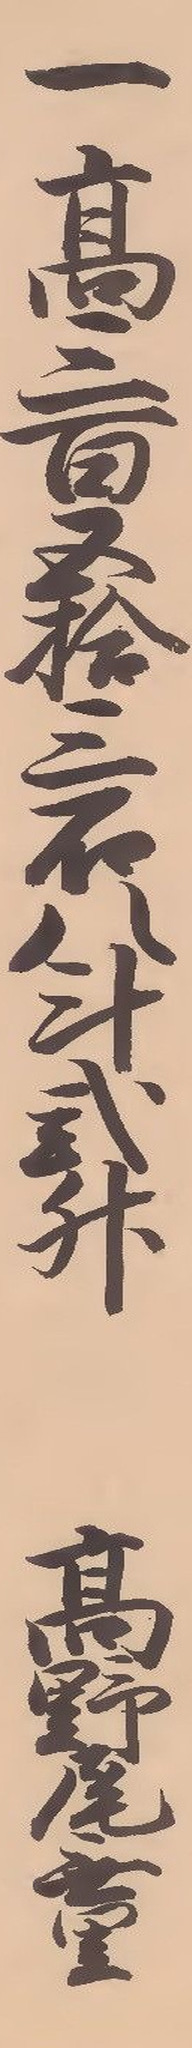一高三百五拾三石八斗弐升高野尾無里
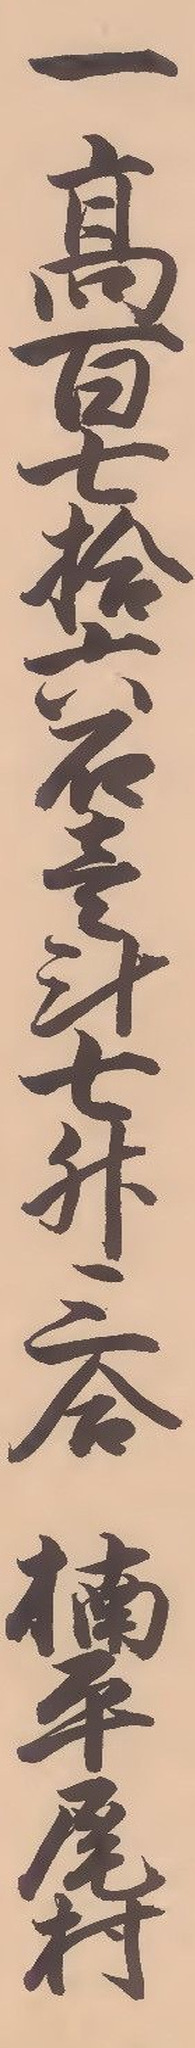一高百七拾六石壱斗七升三合楠平尾村
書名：伊勢国郷帳
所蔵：国立公文書館 National Archives of Japan
